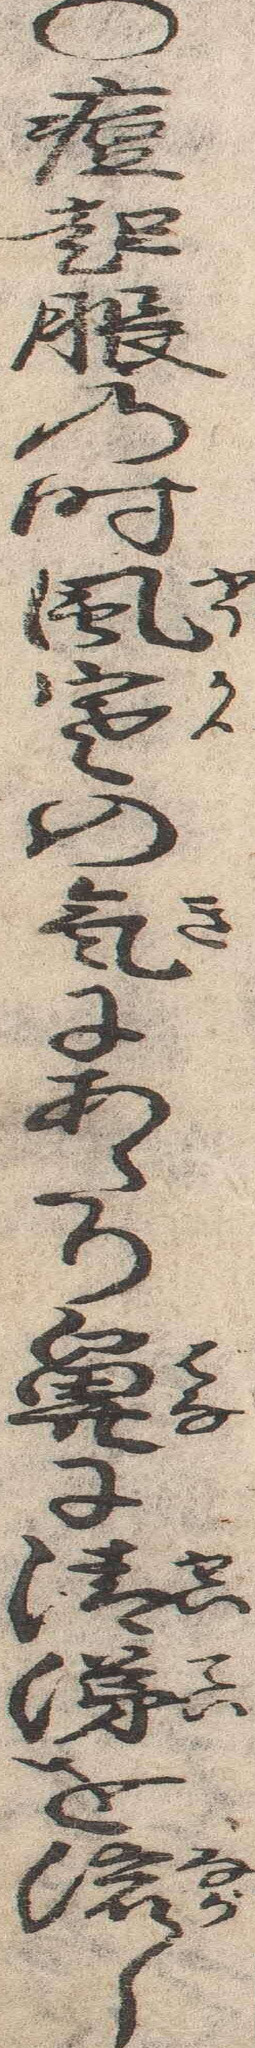○痘起脹の時風寒の気にあたり鼻に清涕を流し

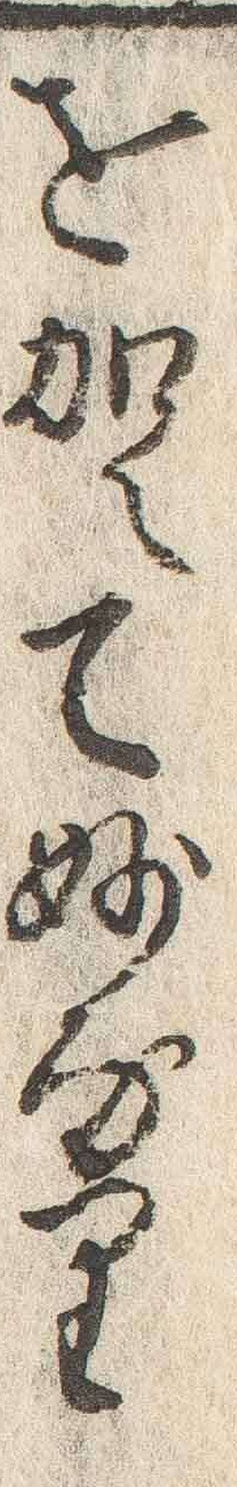を加えて妙なり
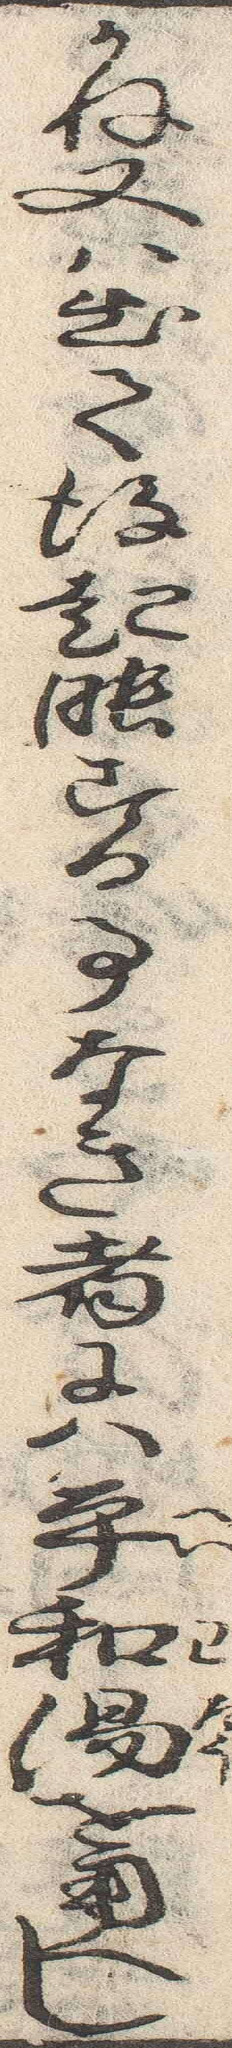かね又は出て後起脹する事なき者には平和湯を用へし
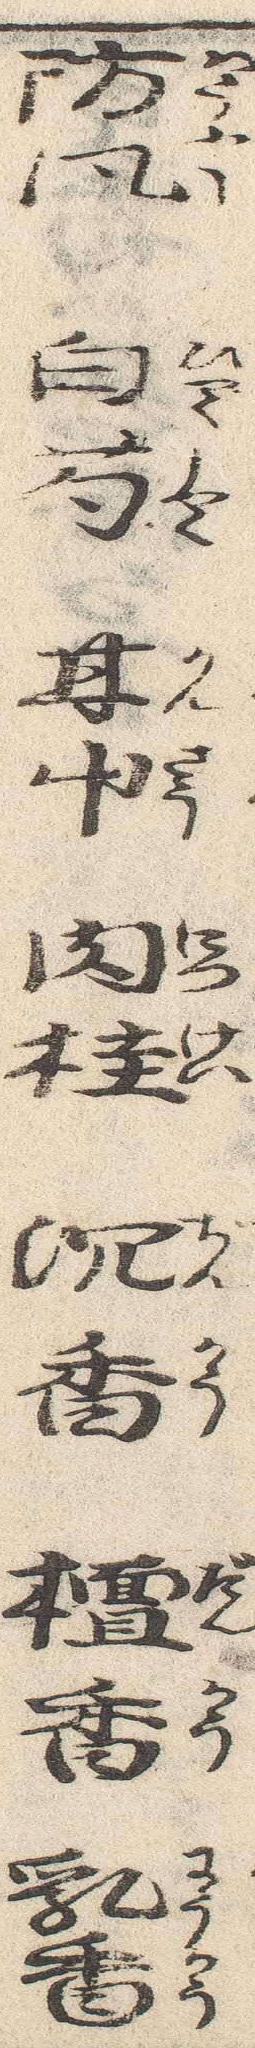防風白芍甘草肉桂沈香檀香乳香
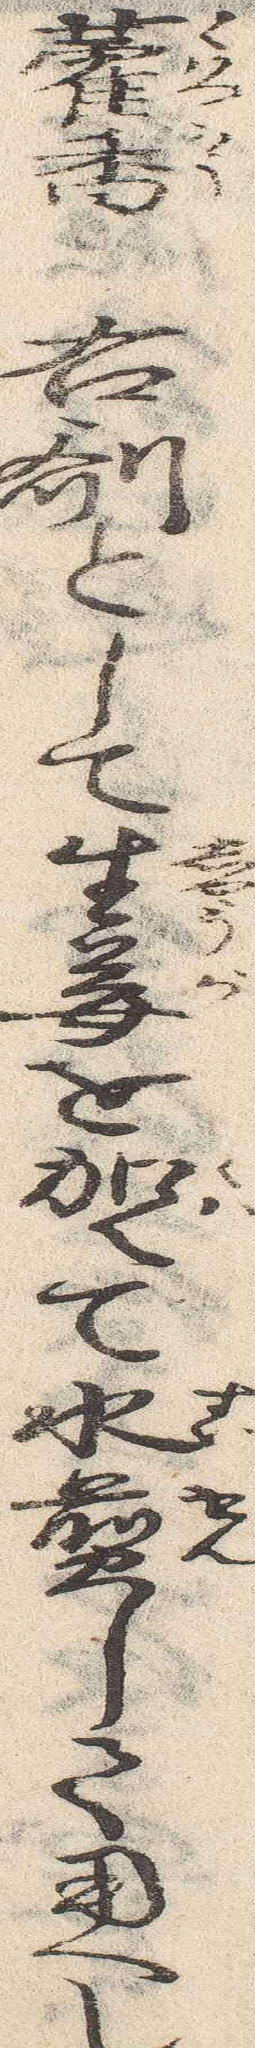藿香右剤として生姜を加えて水煎して用へし
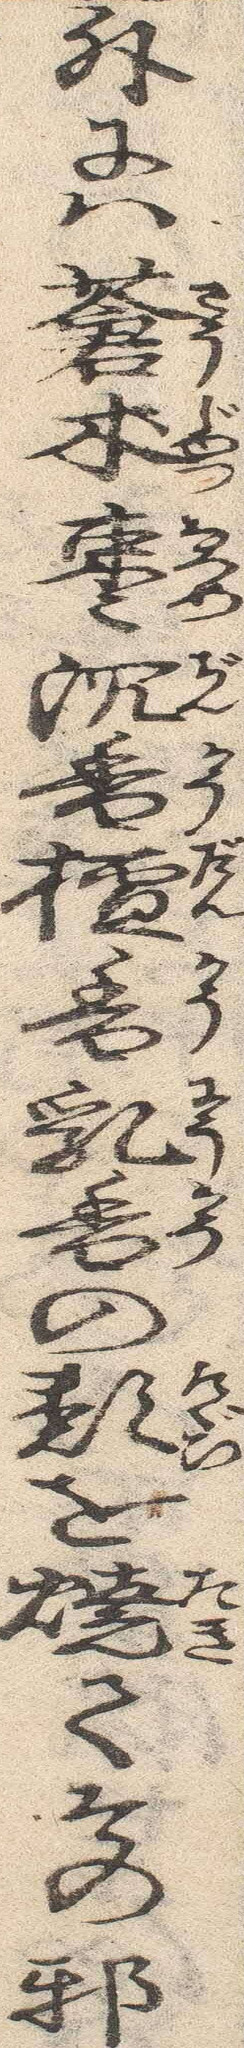外には蒼朮棗沈香檀香乳香の類を焼てその邪
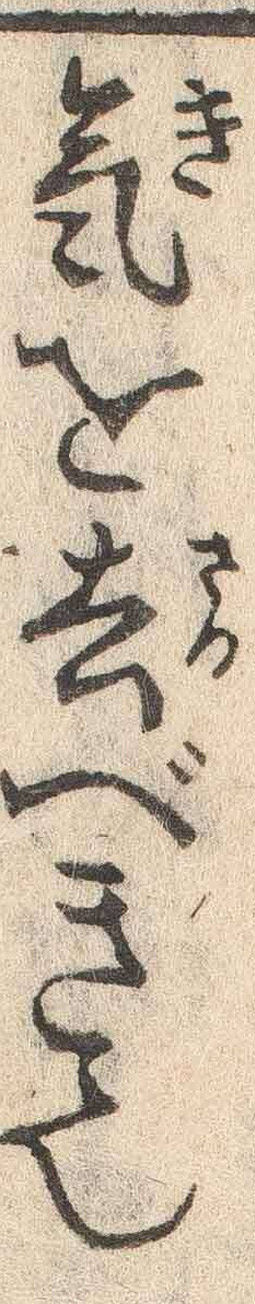気を去べき也
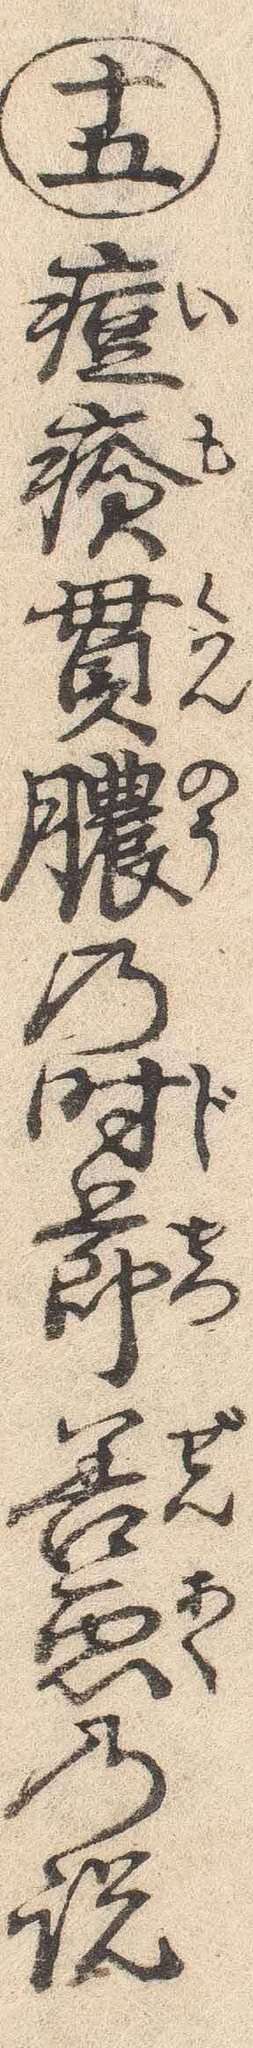(十五)痘瘡貫膿の時節善悪の説
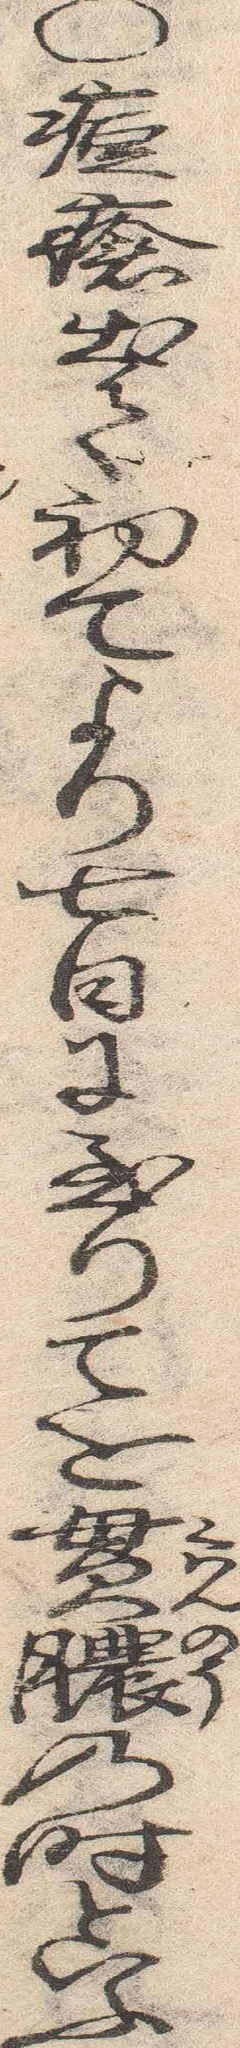○痘瘡出て初てより七日に至りてを貫膿の時といふ
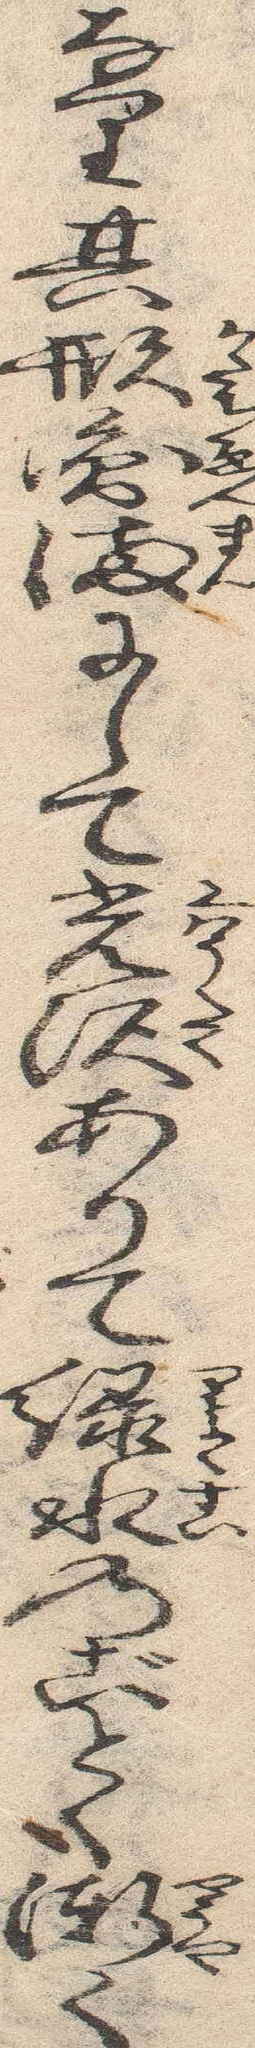なり其形円満にして光沢ありて緑水のごとく漸く
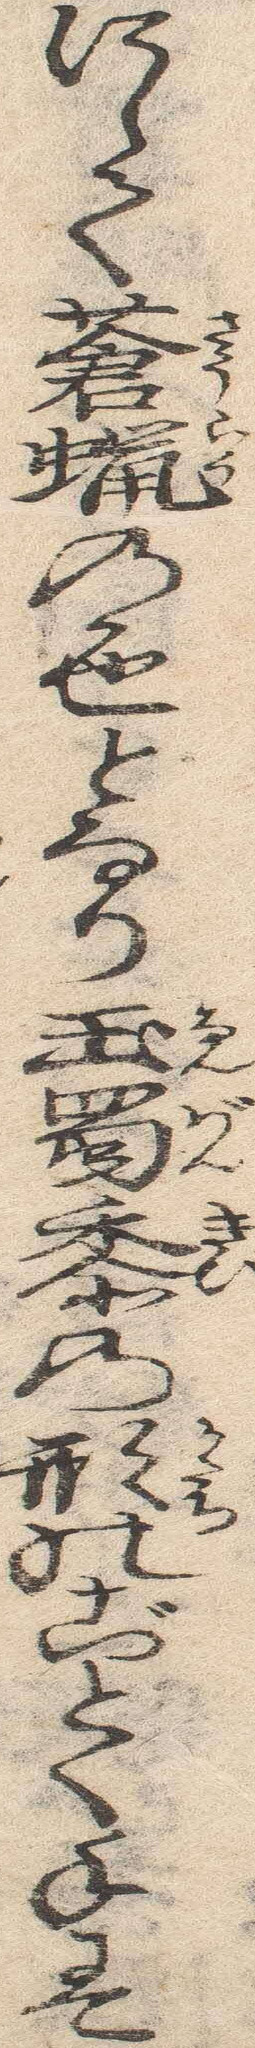にして蒼蠟の色となり玉蜀黍の形のごとく手にて
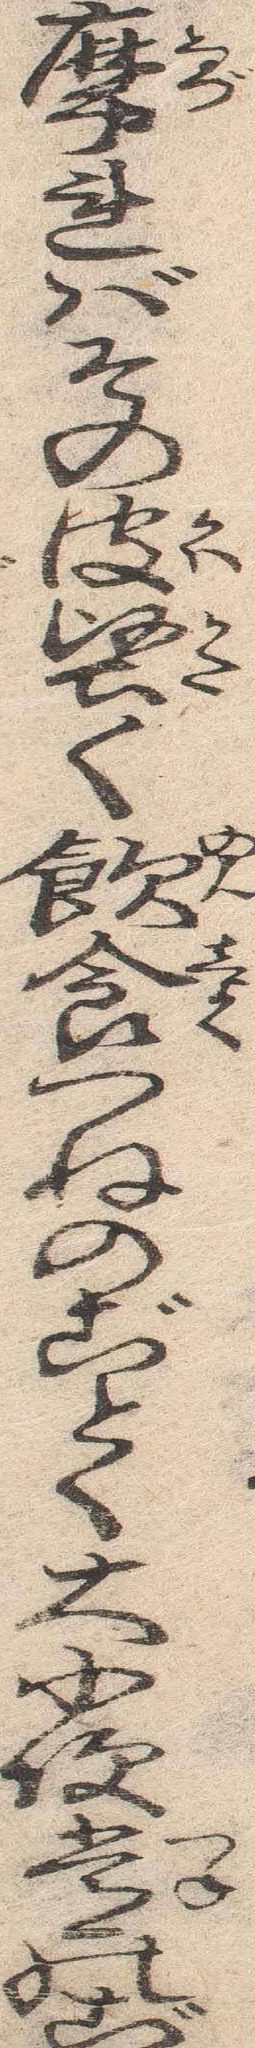摩ればその皮堅く飲食つねのごとく大小便常のご
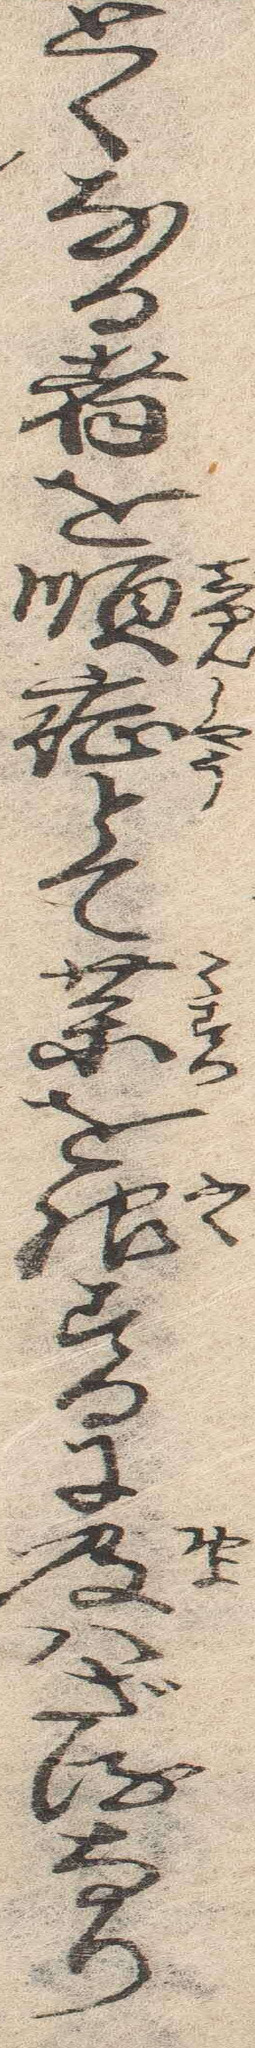とくなる者を順症とて薬を服するに及はざるなり
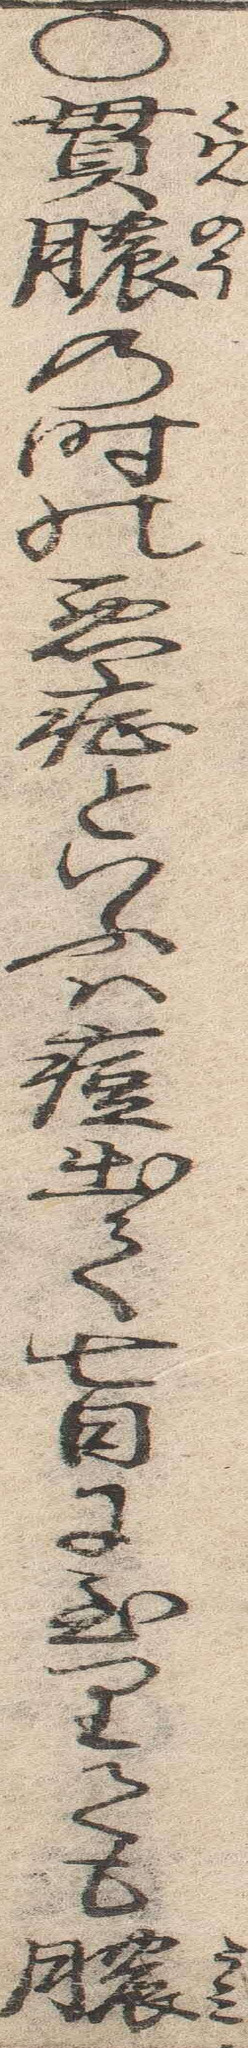○貫膿の時の悪症といふは痘出て七日に至りても膿
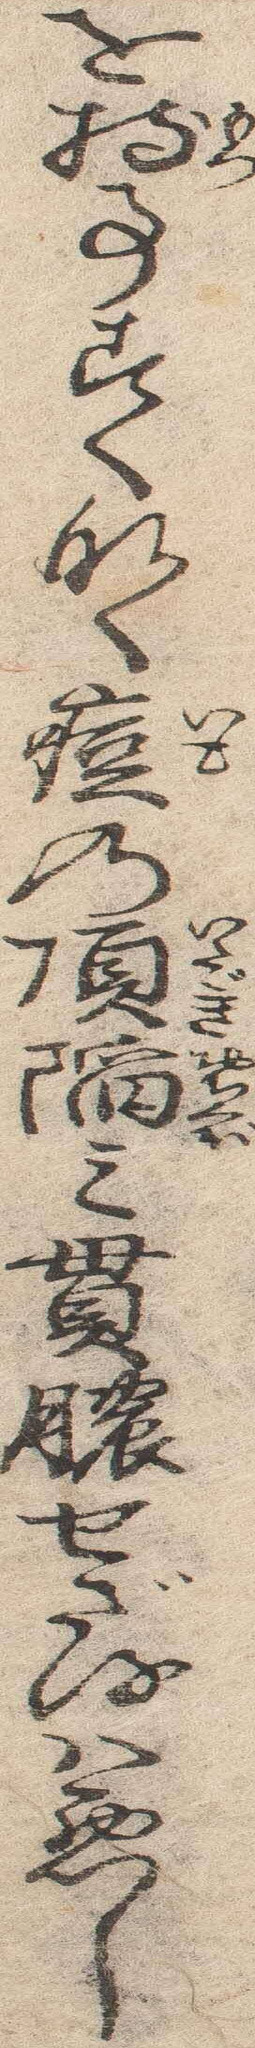を持事すくなく痘の頂陥み貫膿せざるは悪し
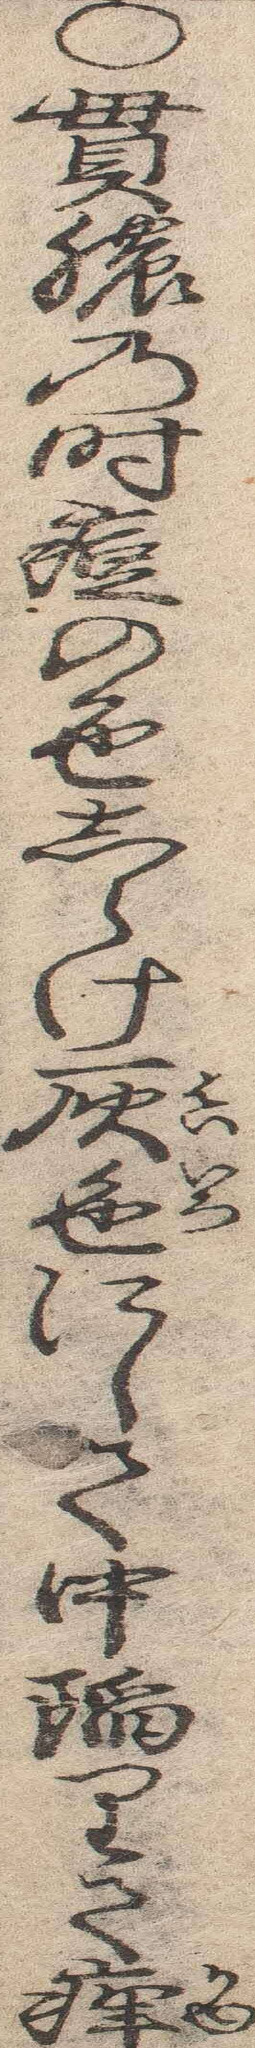○貫膿の時痘の色しらけ灰色にして中陥りて痒
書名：小児必用養育草
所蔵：東京学芸大学附属図書館 国文学研究資料館
